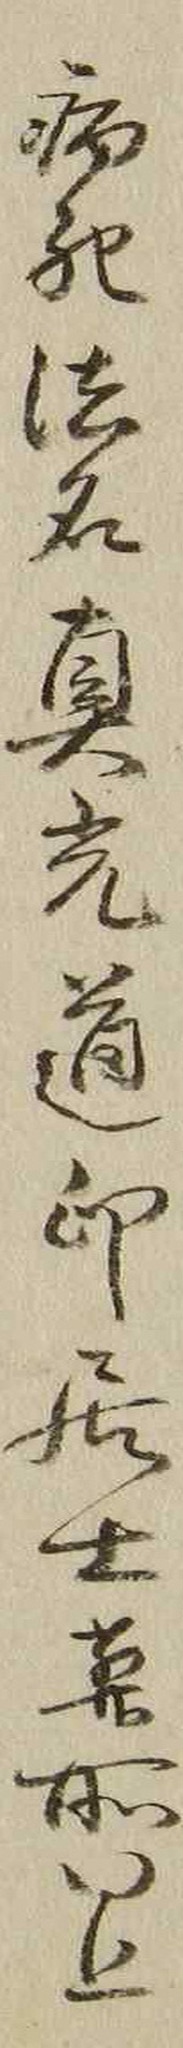病死法名真光道印居士葬所同上
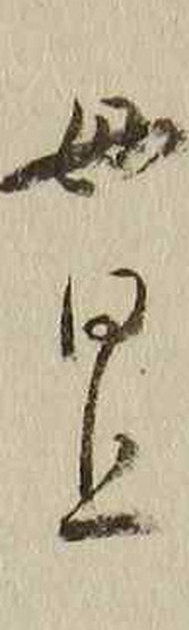母同上
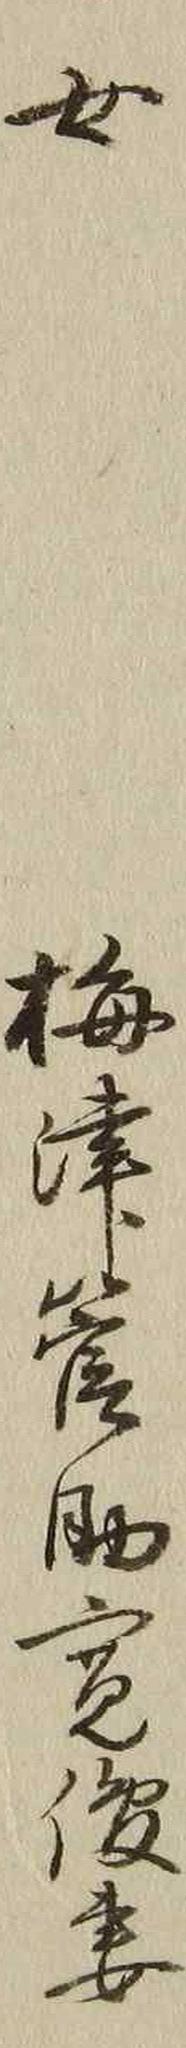女梅津管助寛俊妻
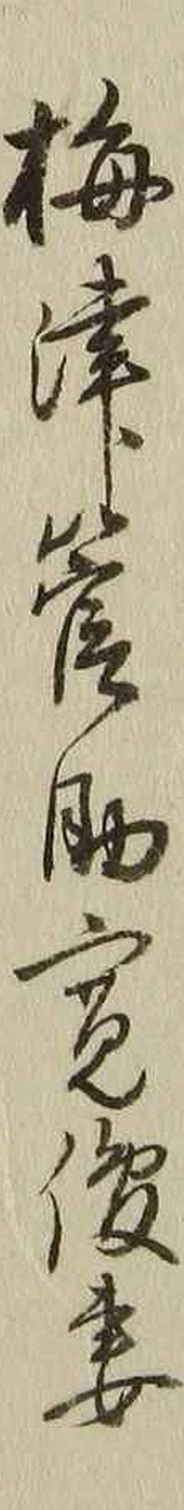女梅津管助寛俊妻
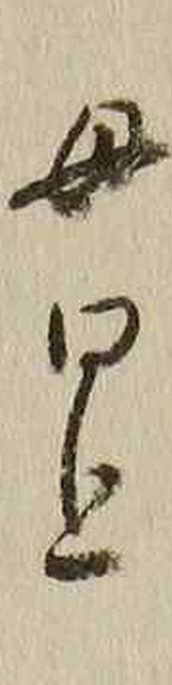母同上
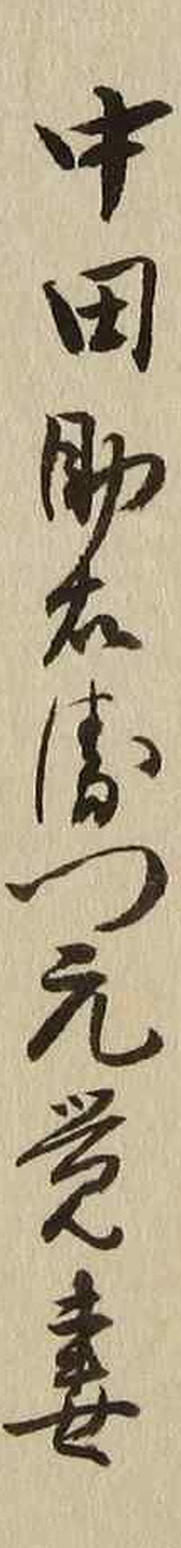女中田助右衛門元覚妻
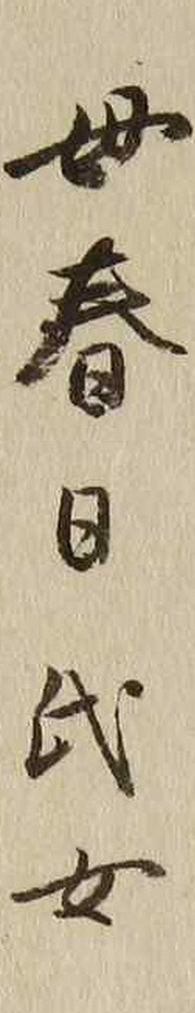母春日氏女
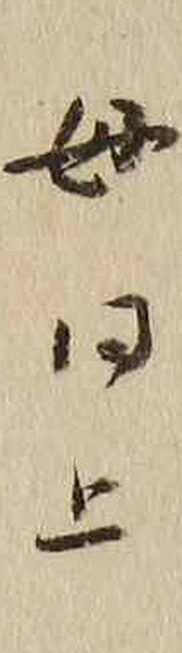母同上
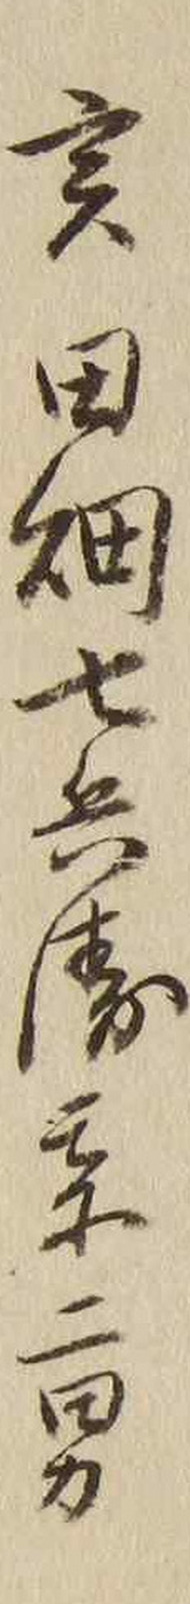実田畑七兵衛某二男

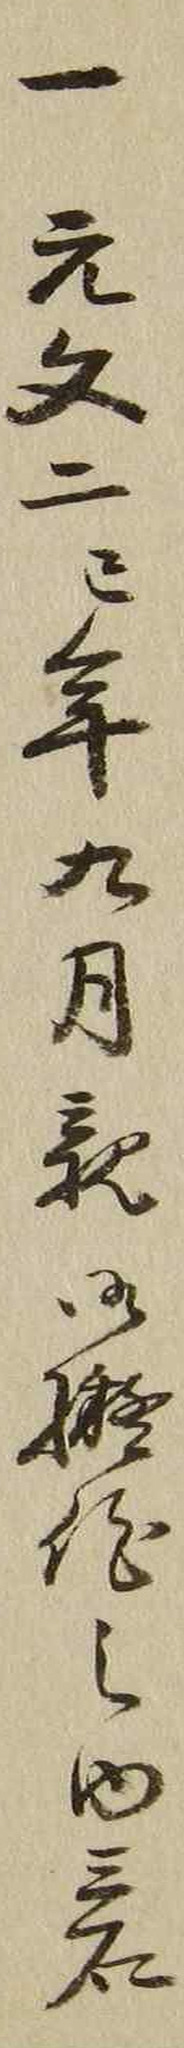一元文二巳年九月親御擬作之内三石
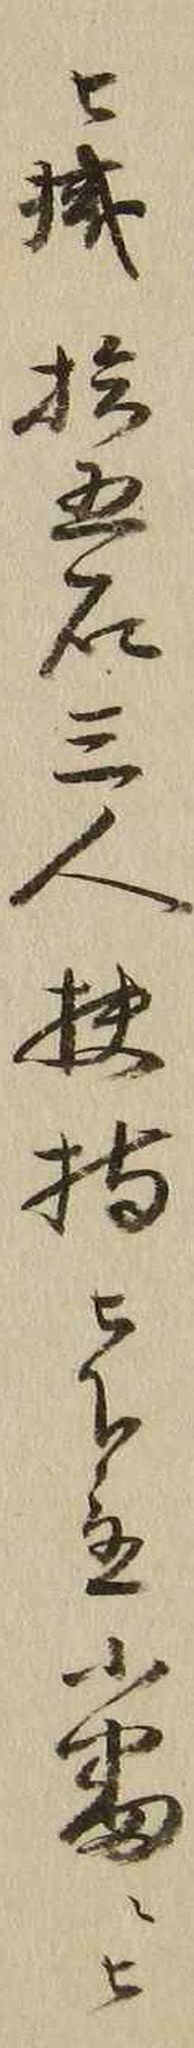被減拾五石三人扶持被下置小番ニ被
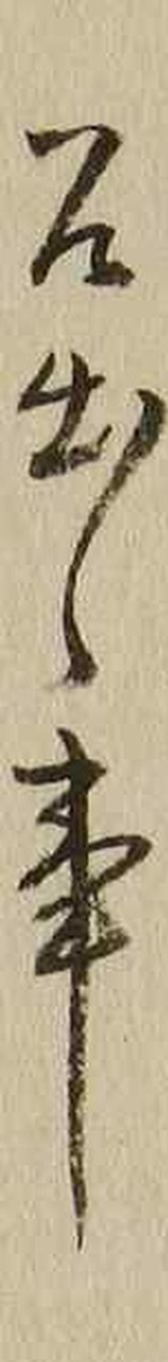召出候事
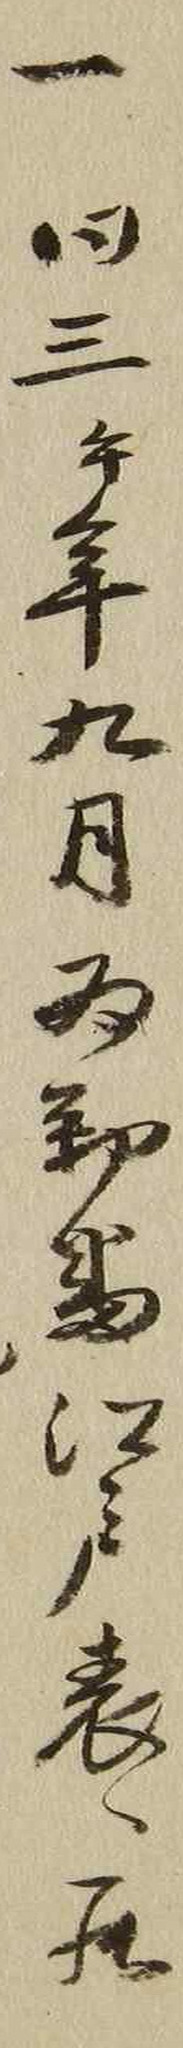一同三午年九月為勤番江戸表へ罷
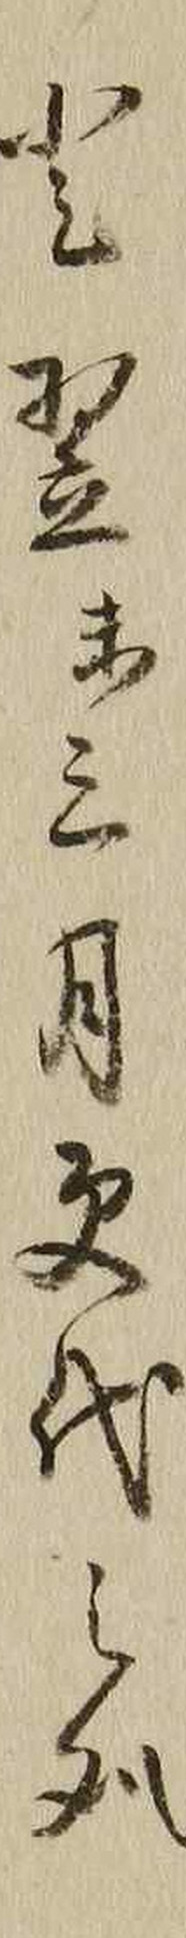登翌未三月交代之処
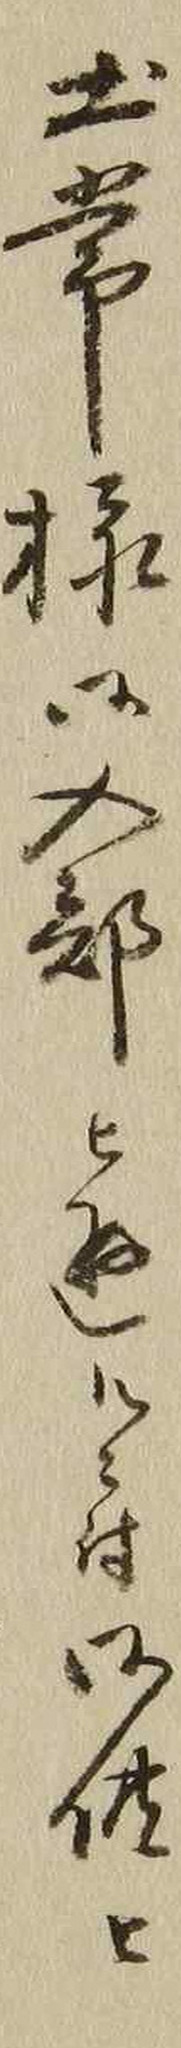土常様御入部被遊候ニ付御供被
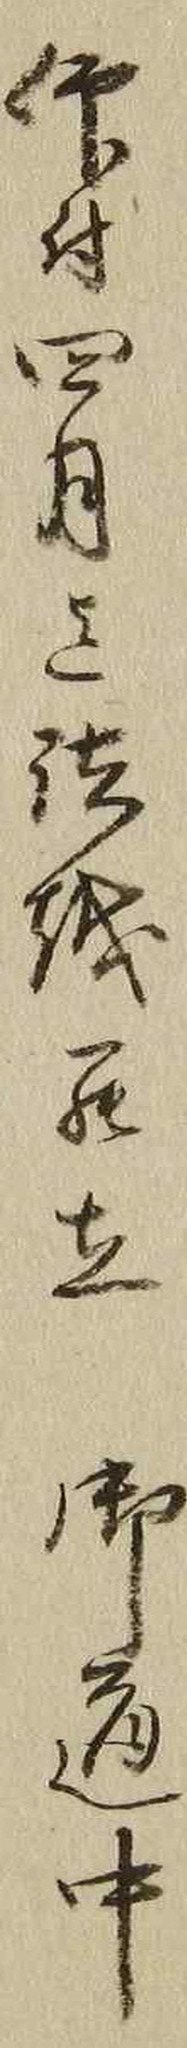仰付四月迄諸越罷在御道中
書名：諸士系譜　巻之236　ふ之部4
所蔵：会津若松市立会津図書館
